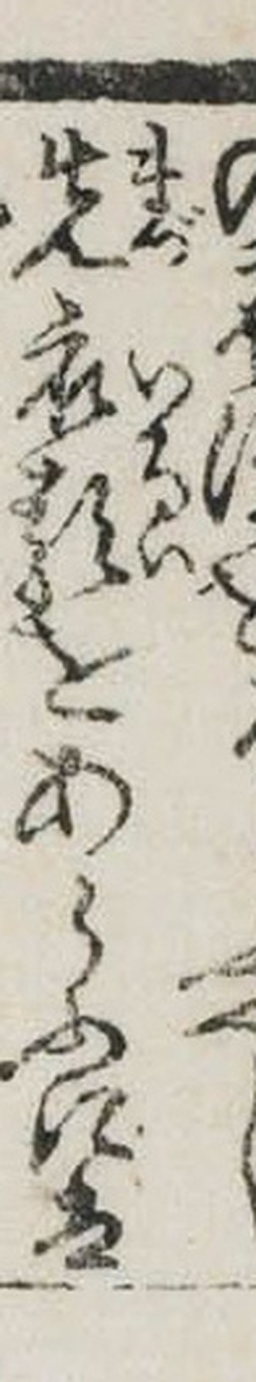先衣類をあらふには
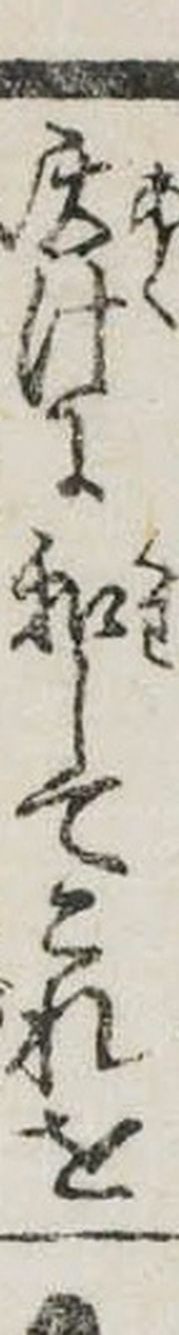灰汁に和してこれを
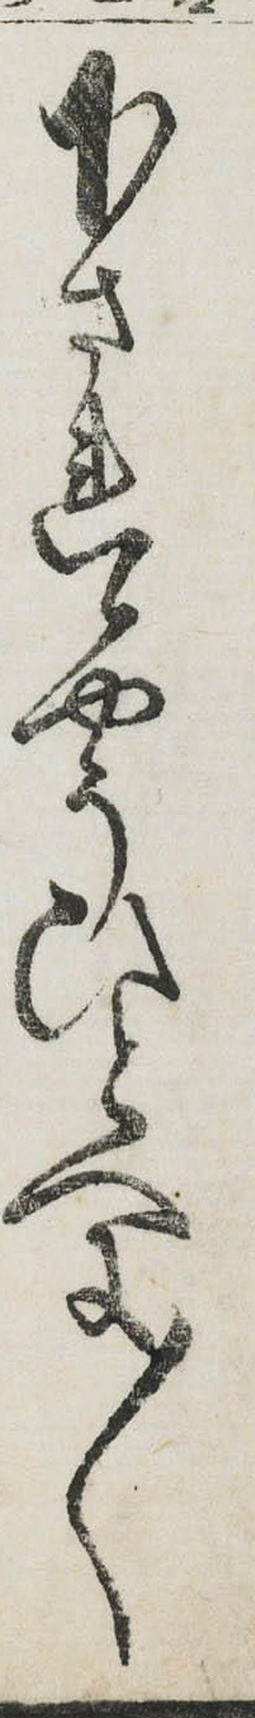下され候やうひとへに〳〵
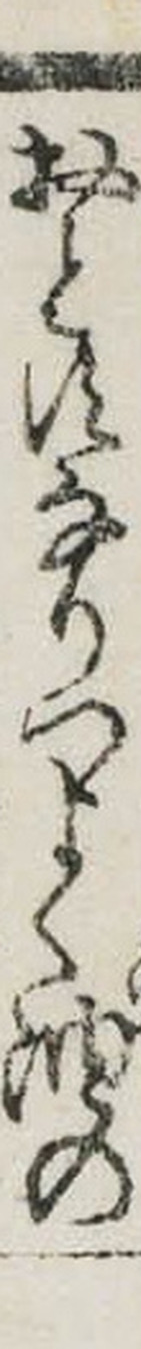おとすなりつよく油の
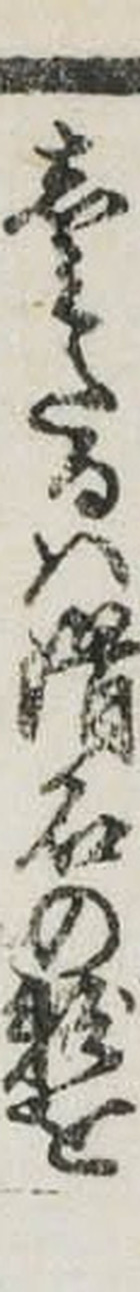しみたるは滑石の粉を
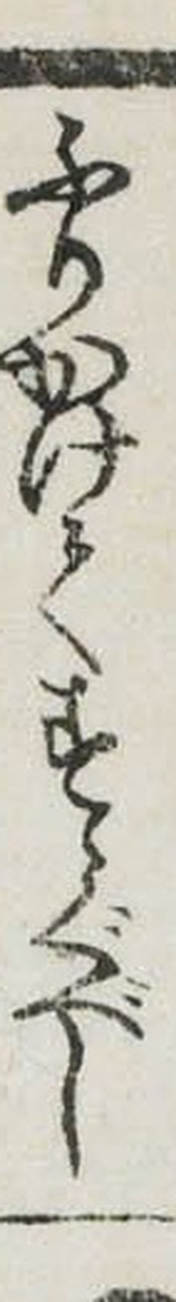ふりかけてすゝぐべし
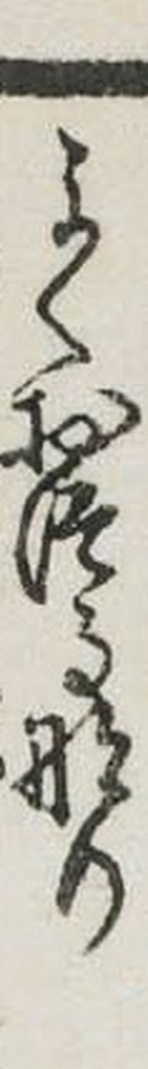よくおつるなり
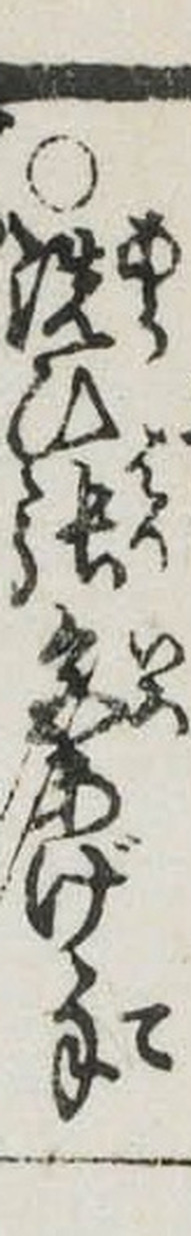○洗ひ張色あげ手
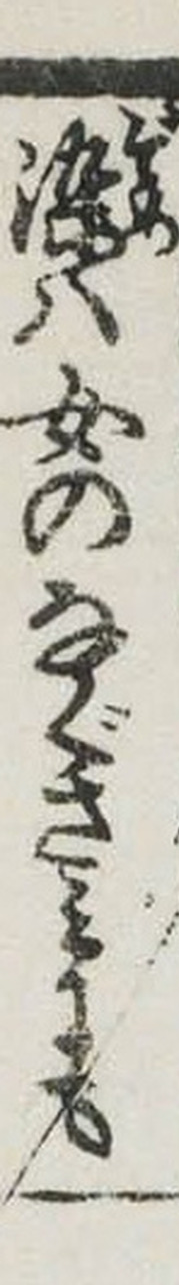染は女のなぐさみにも
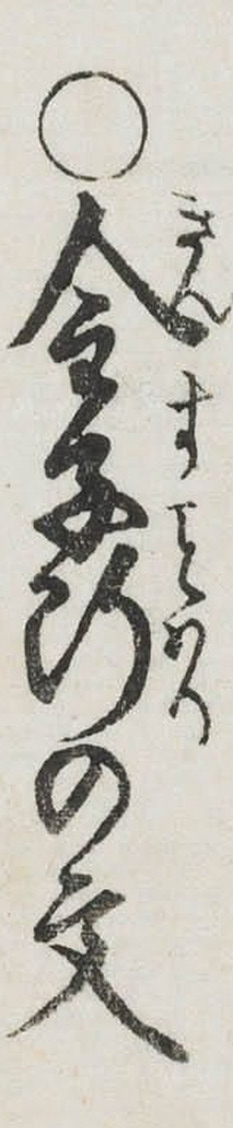○金子断の文
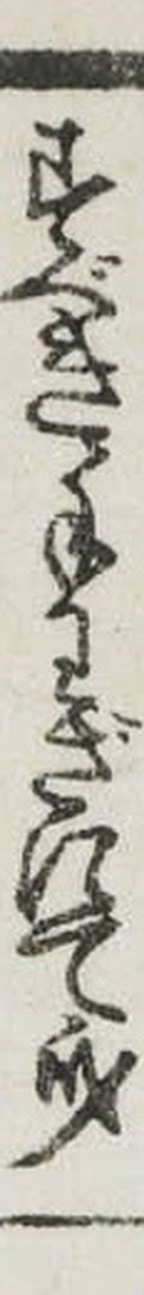すべき手わざにて身
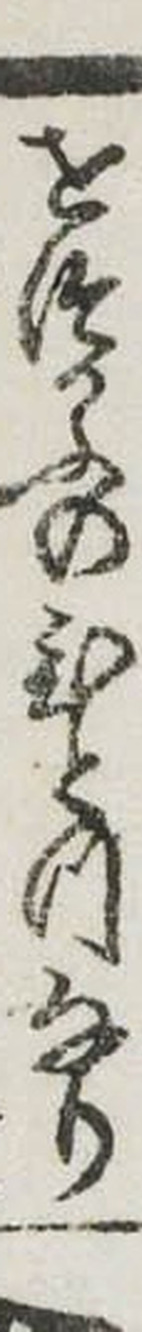をつかふのひとつなり
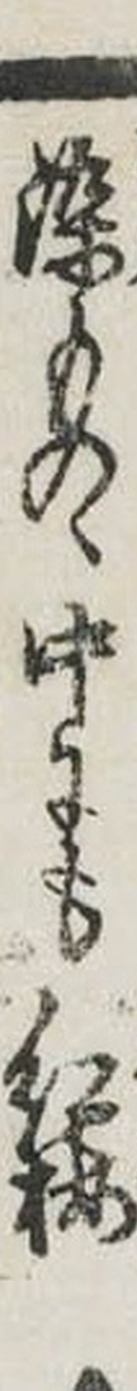染ものゝ中にも紅梅
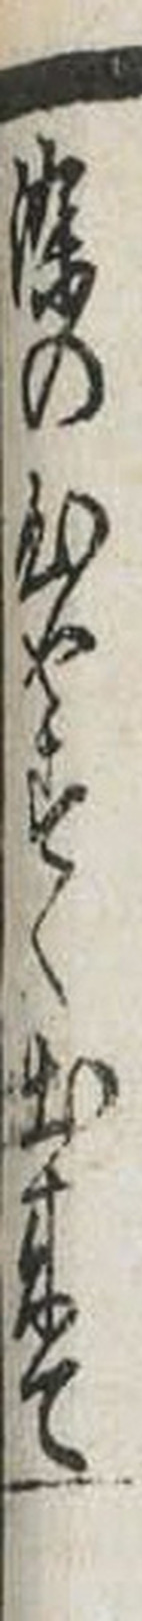染の心やすく出来て
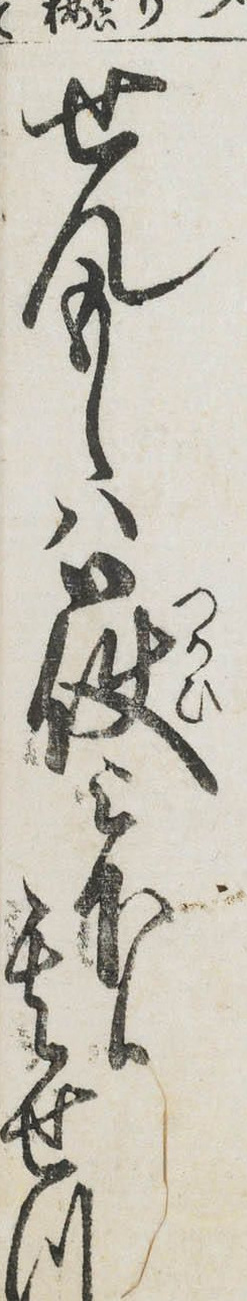せんもしは御使被下候其せつ
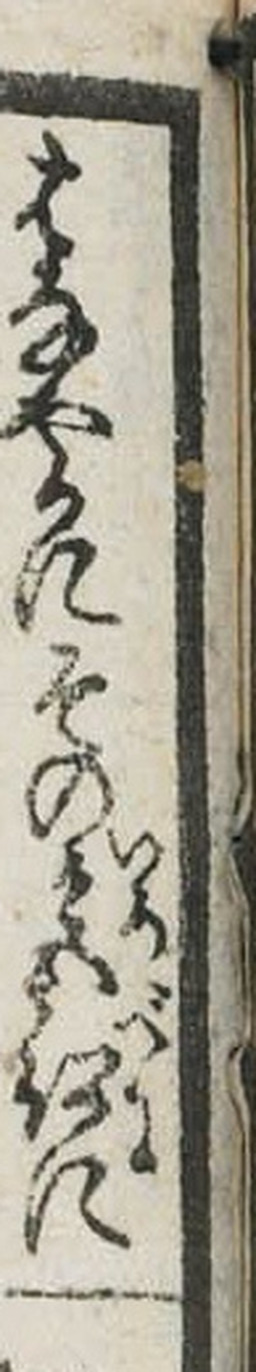はなやかにその色紅に
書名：頭書萬用婦人手紙之文言
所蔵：東京学芸大学教育コンテンツアーカイブ
